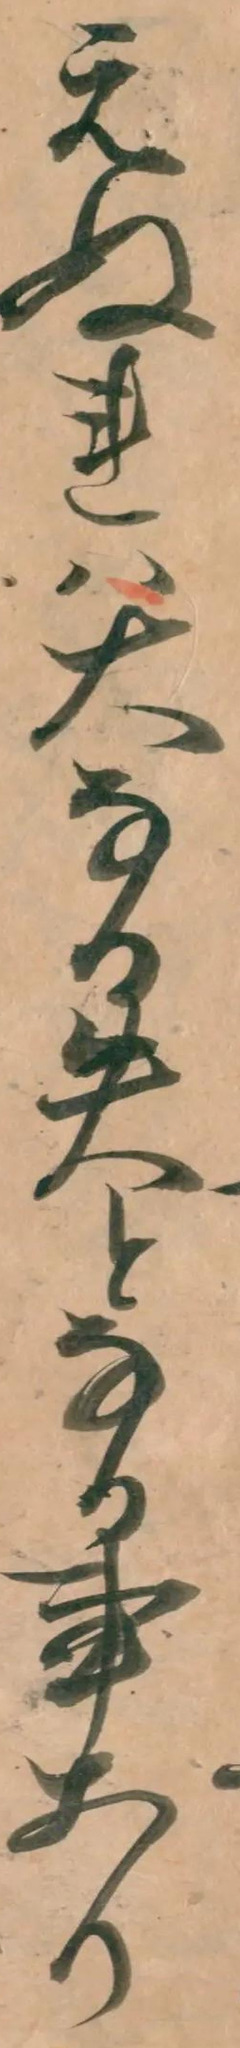えぬれハ大なる失となる事あり
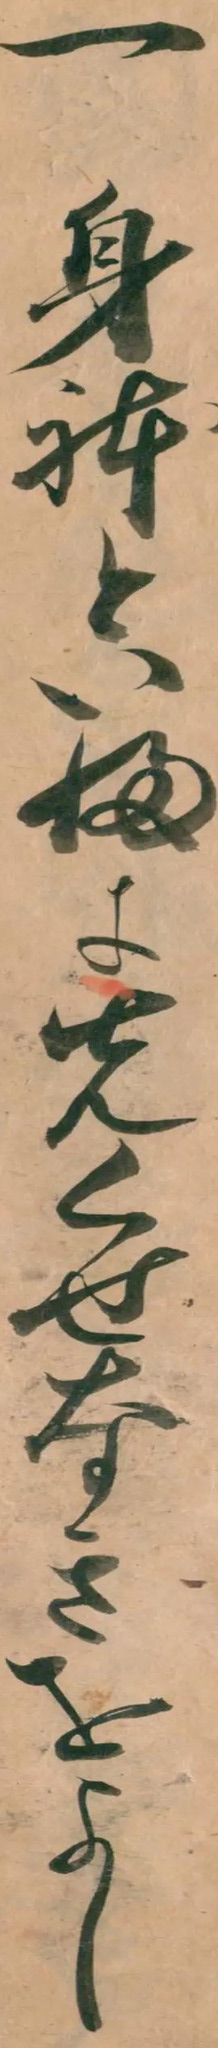一身体といふに先くせなきをよし
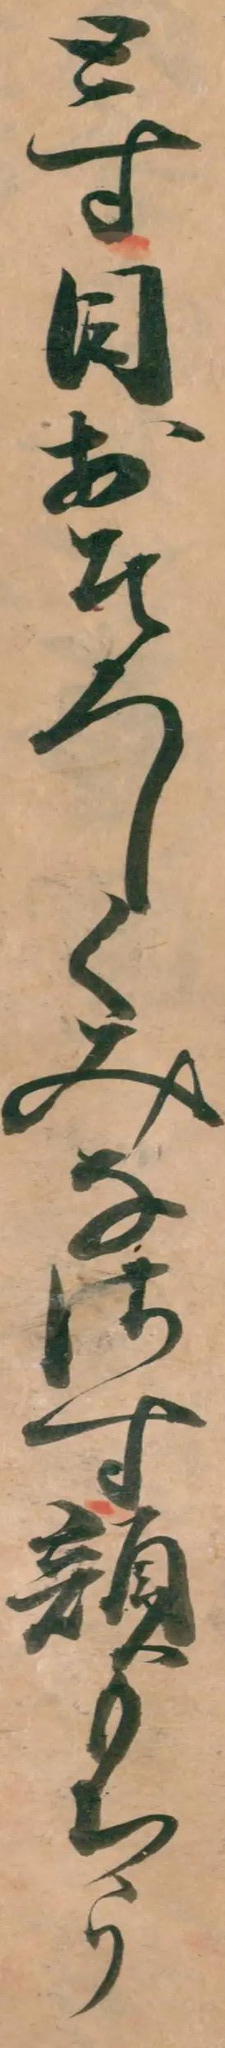とす目おそろしくみなさす顔もちう
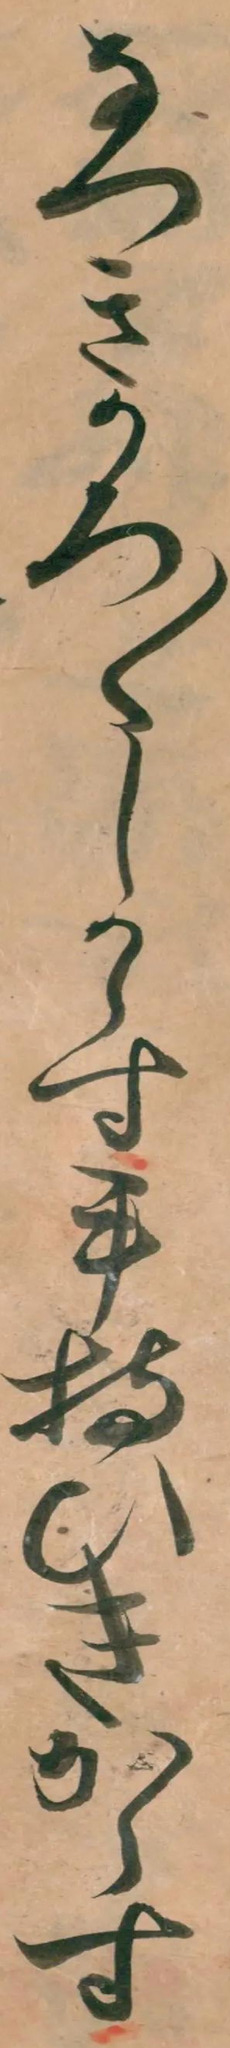なつきかろ〳〵しからす手持ひきからす
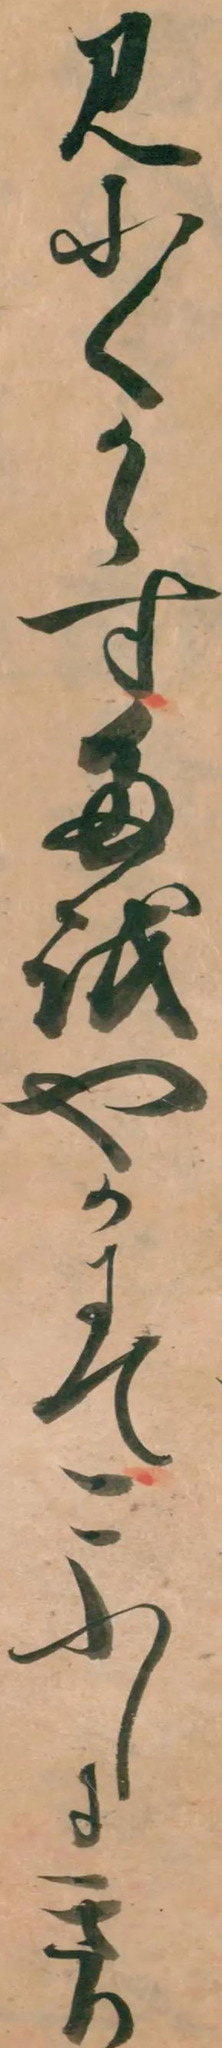見にくからすたをやかにてこふしにきり
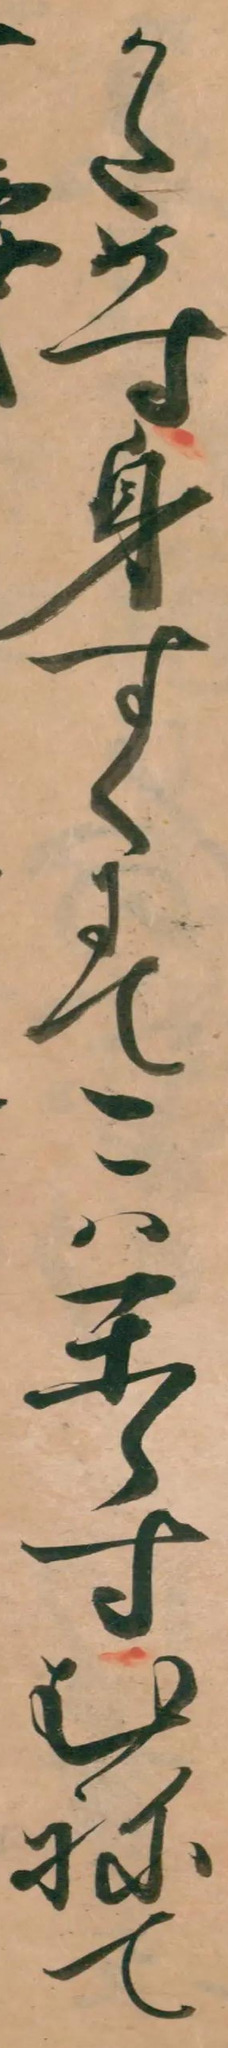かためす身すくにてこハからすむねて
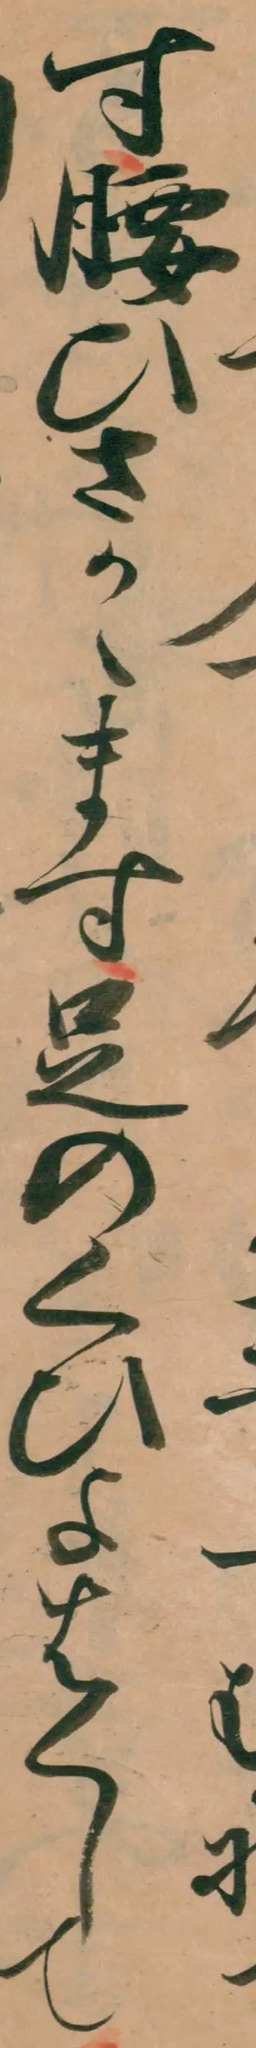寸腰ひさかゝます足のくひよはくして
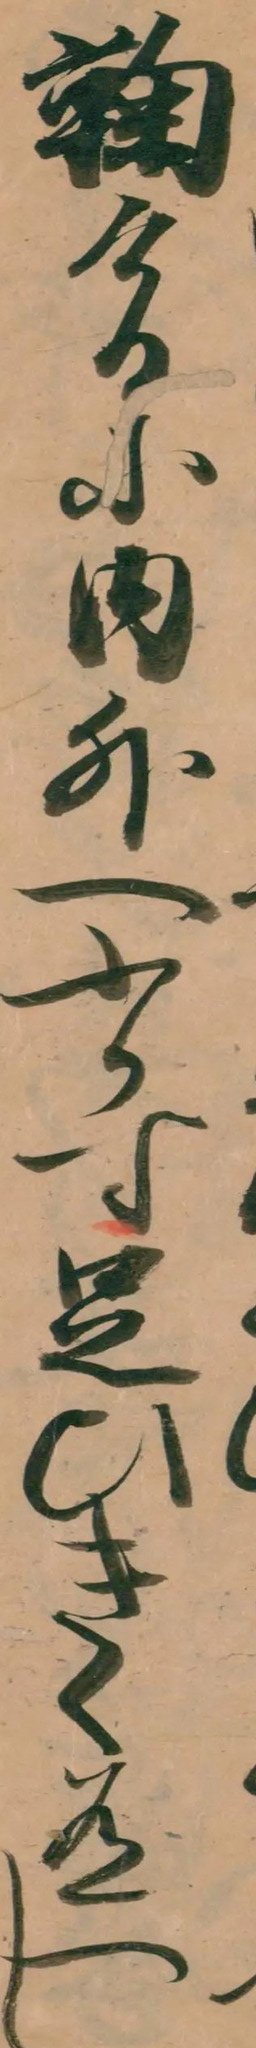鞠けるに内外へふかす足ひきく有へし
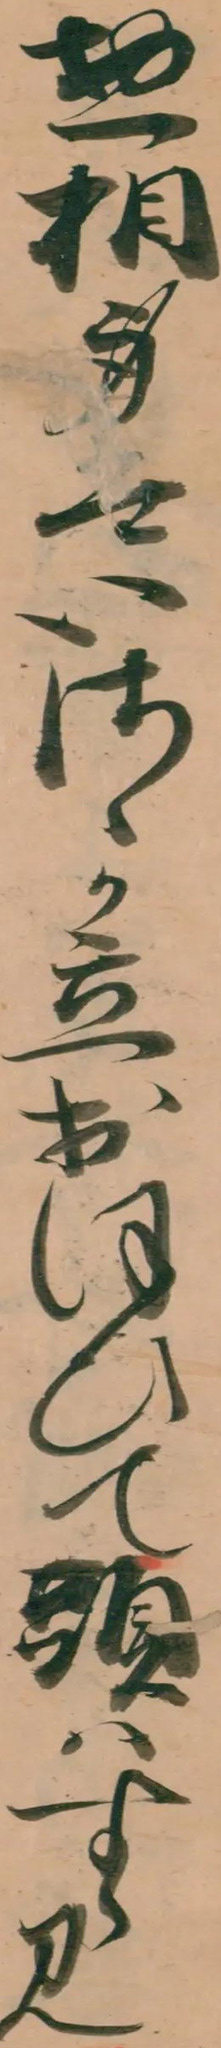惣相身はいさゝか立おほひて頭ハすらみ
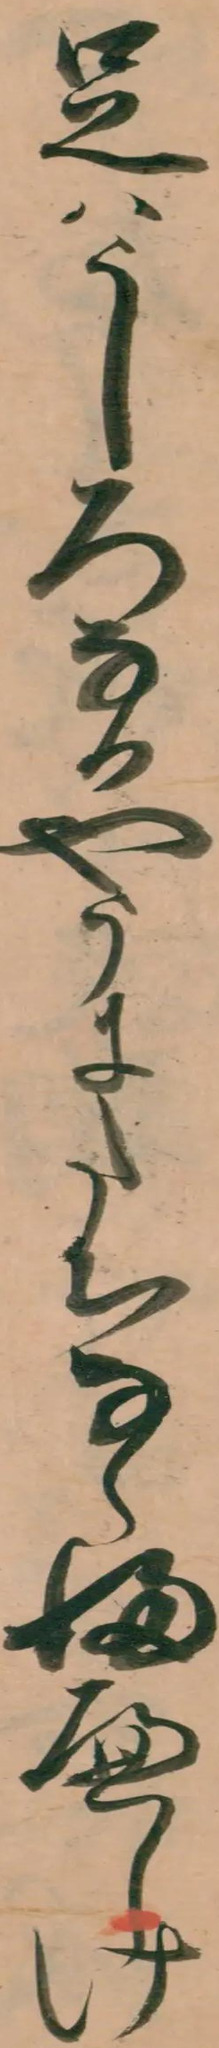足ハうしろなるやうにたちならふへしけ
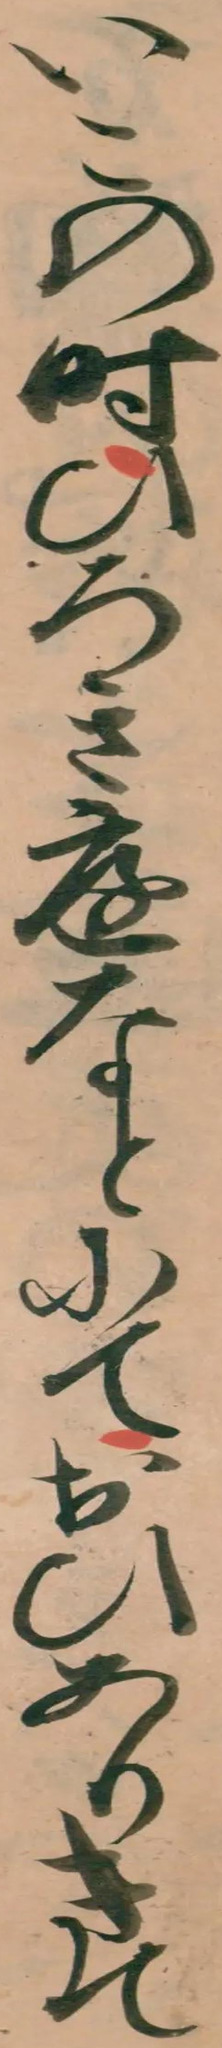いこの時ひろき庭なとにておひありきて
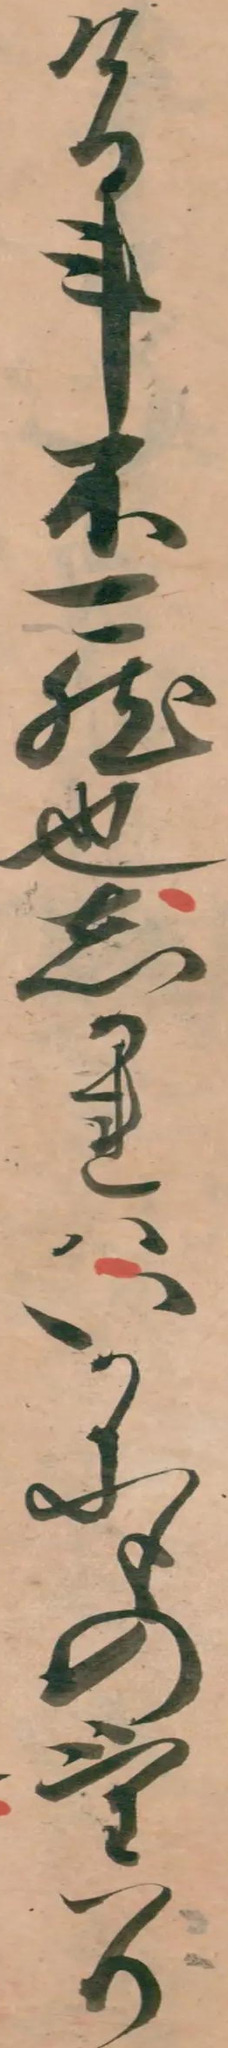ける事不可然也しかれハいかにものけハり
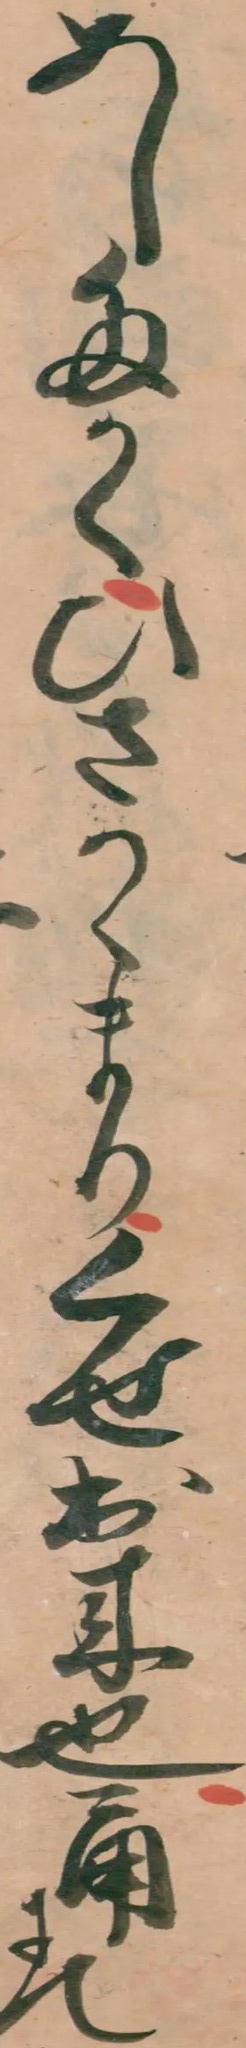あしたかくひさかゝまりてくせ出来也角にて
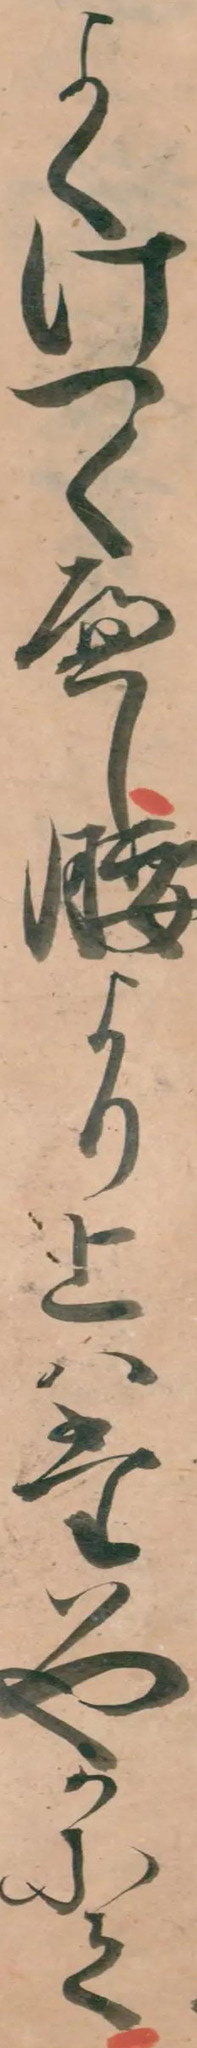よくけつくへし腰より上ハたはやかにて
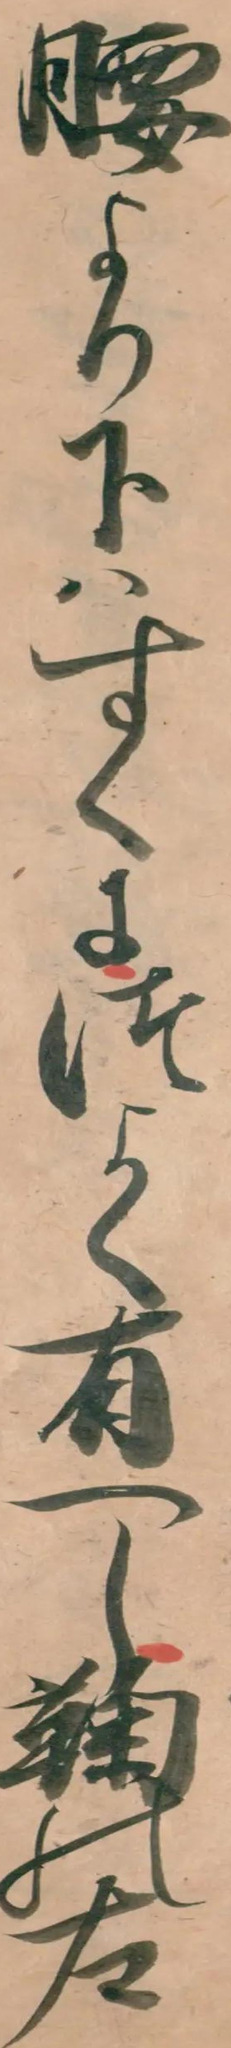腰より下ハすくにつよく有へし鞠の左
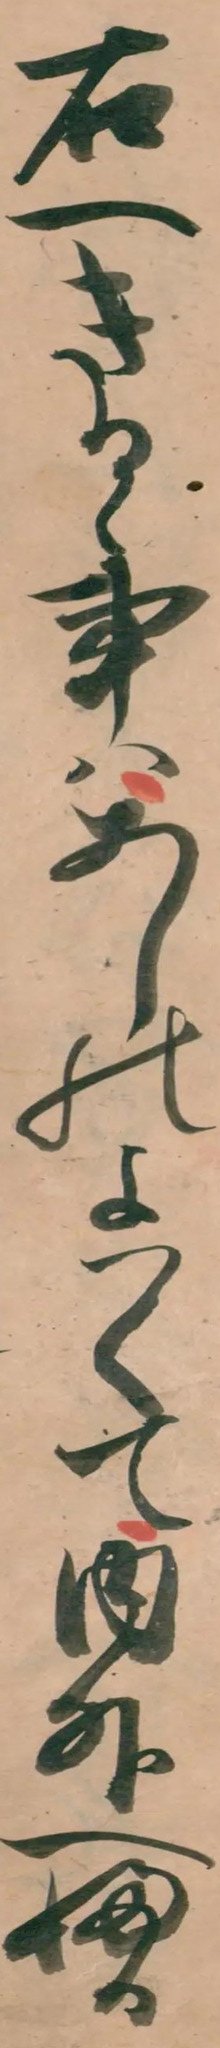右へきるゝ事ハあしのよハくて内外へふる
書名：蹴鞠之条々大概
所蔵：国立国会図書館 National Diet Library, JAPAN
